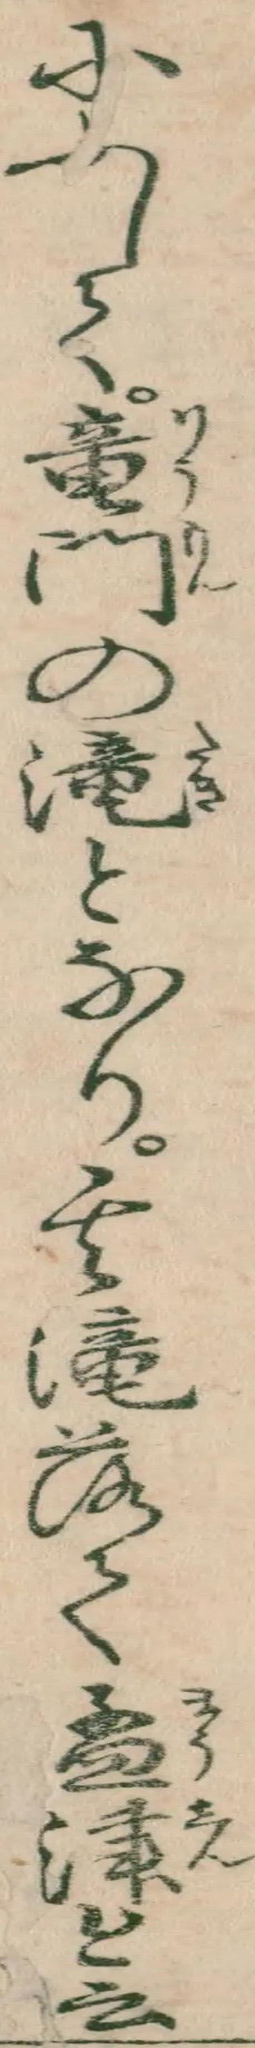にふして。竜門の滝となり。其滝落て孟津と云
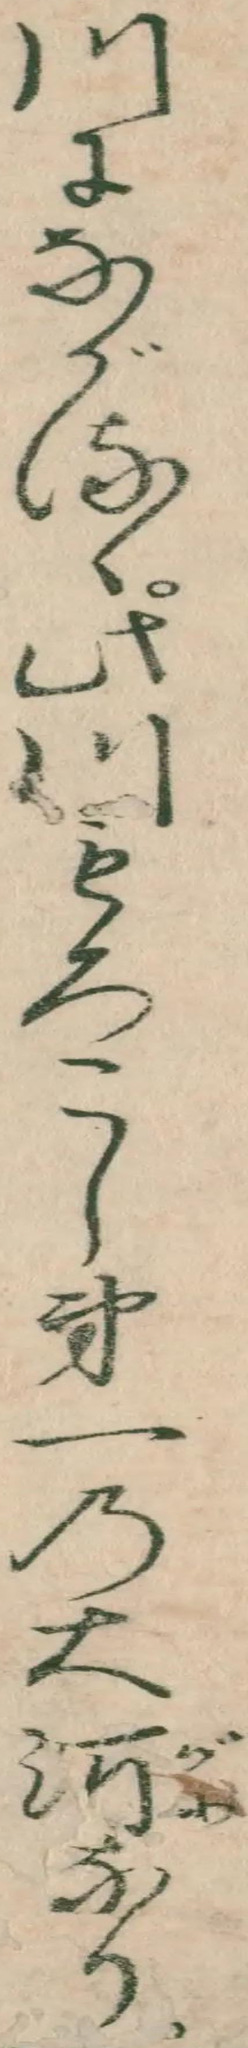川にながるゝ。此川もろこし第一の大河なり。
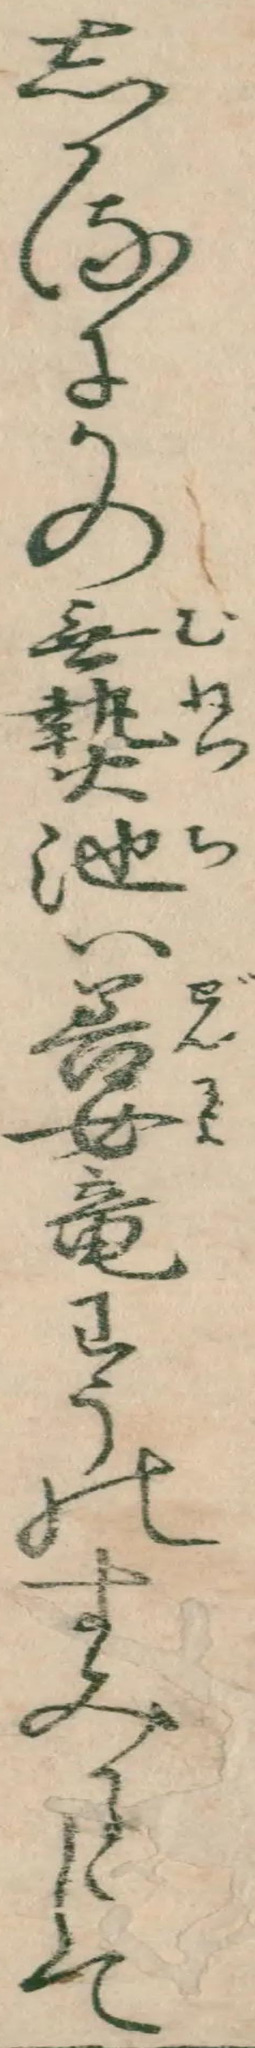しかるにかの無熱池じゃ善女竜わうのすみかにして
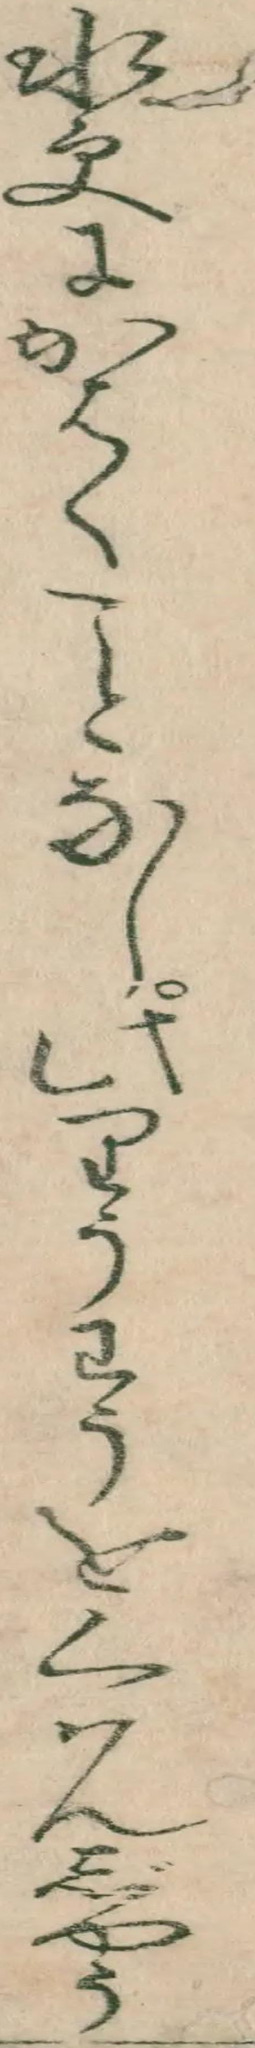水更にかはくことなし。此りうわうをくはんじやう
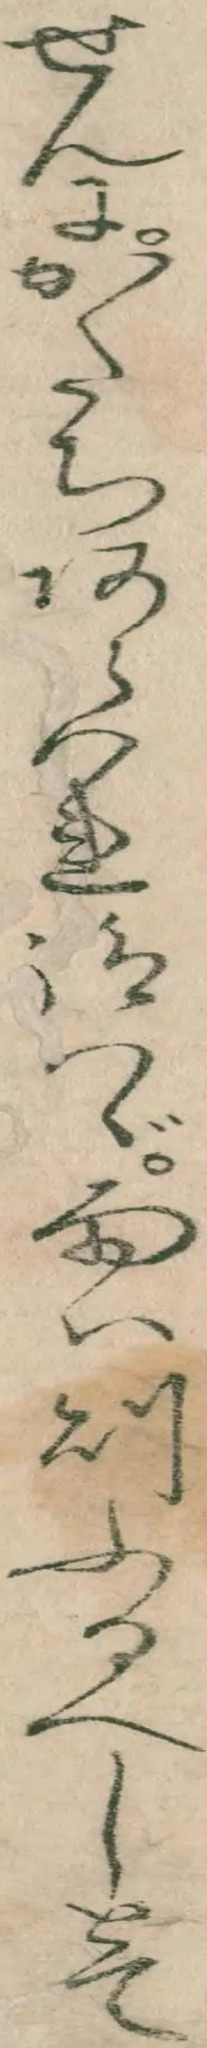せんに。かたちあらはれ給はゞ。雨は則ふるへしとて
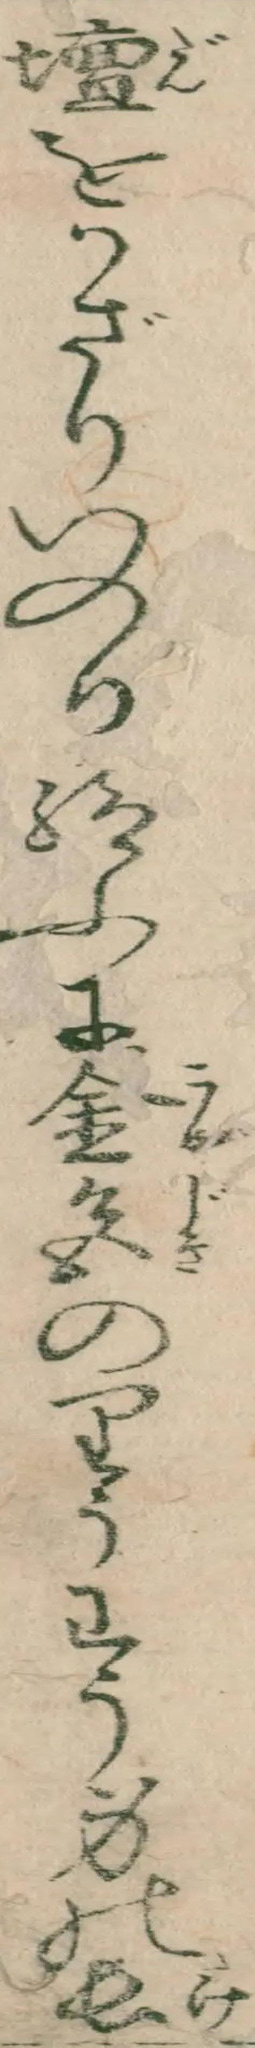壇をかざりいのり給ふに金色のりうわう身の長
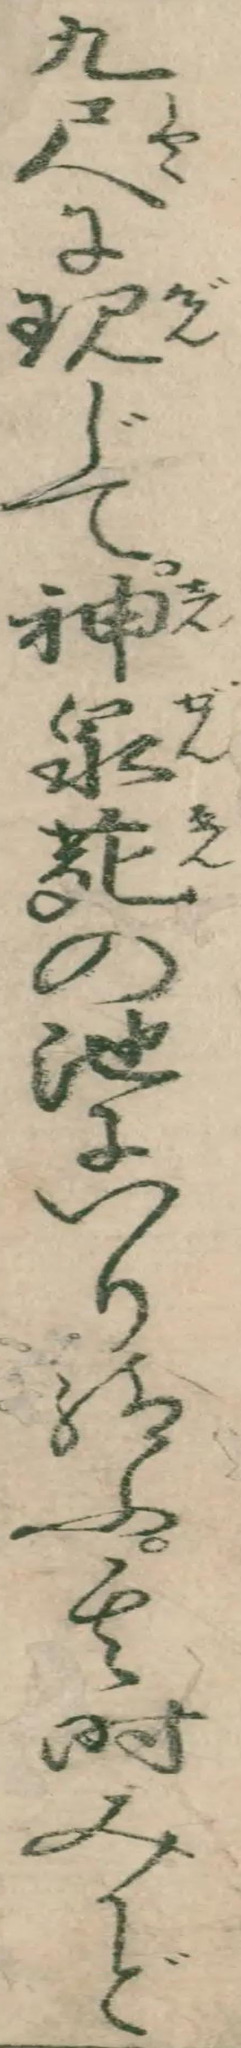九尺に現じて神泉苑の池にいり給ふ。其時みかど

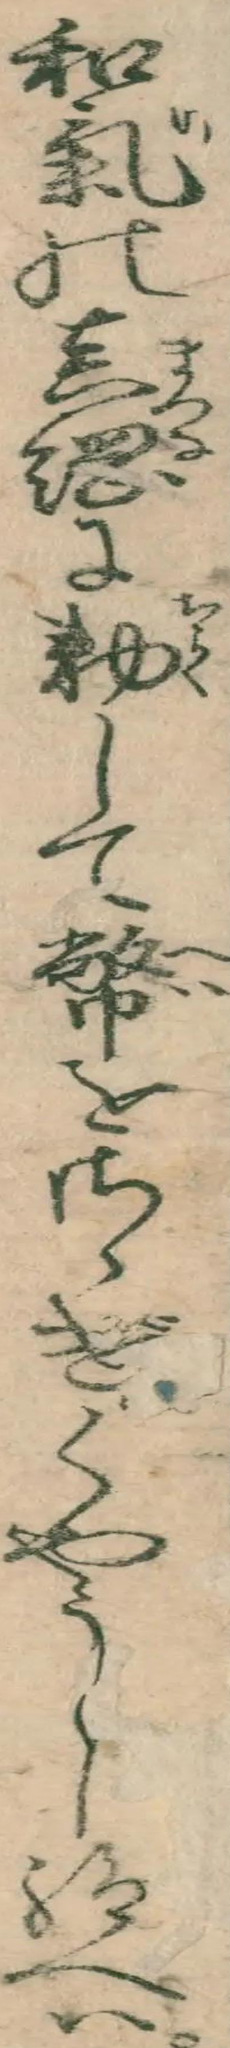和気真綱に勅して幣をさゝげ。くやうし給へは。
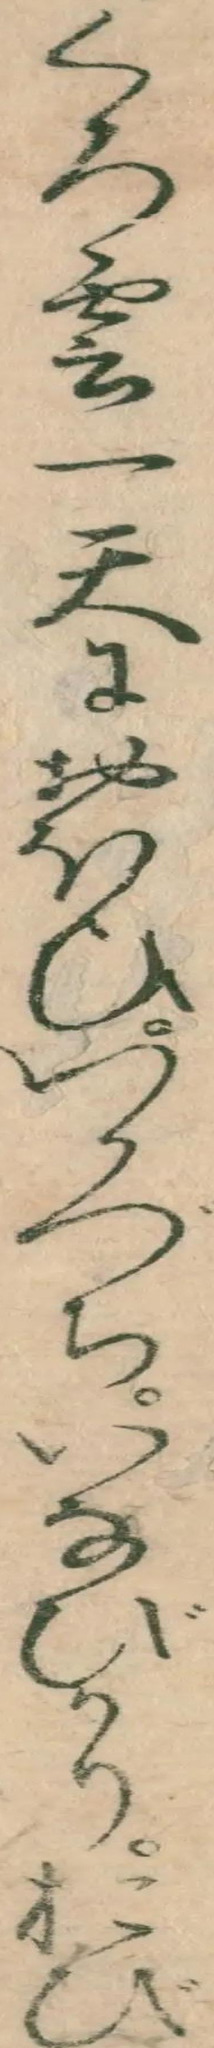くろ雲一天におほひ。いかつち。いなびかり。おび
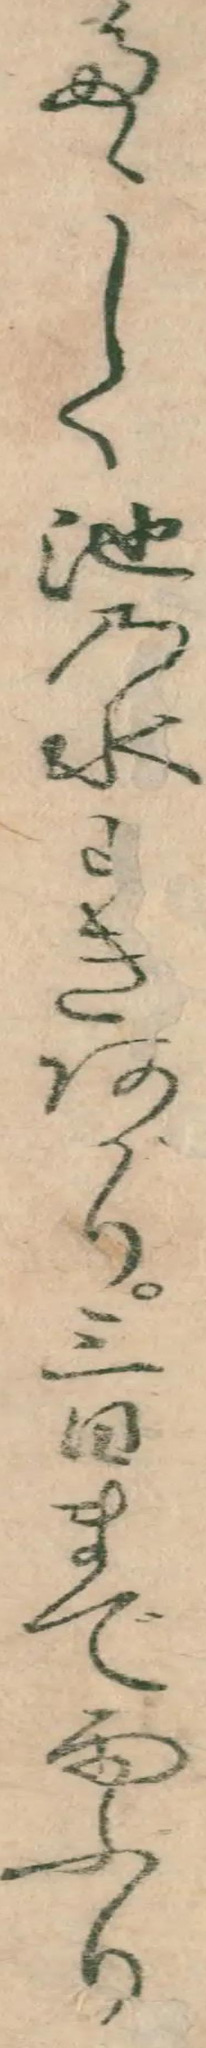たゝしく池の水わきあがり。三日まで雨ふり
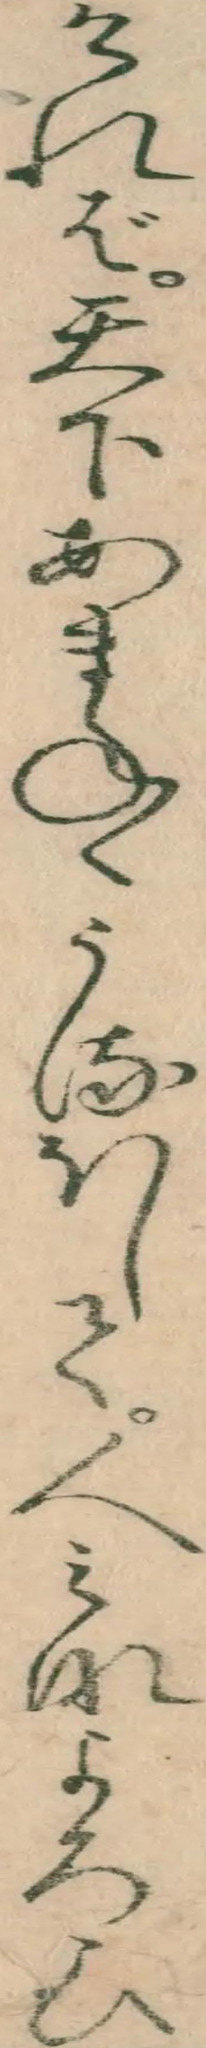ければ。天下あまねくうるほして。人みなよろこひ
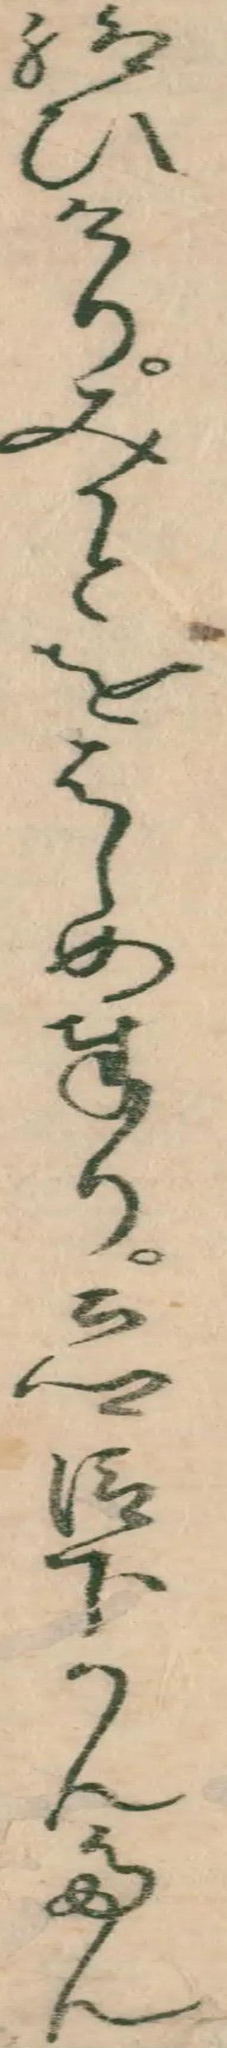給ひけり。みかとをはしめ奉り。公卿臣下かんたん
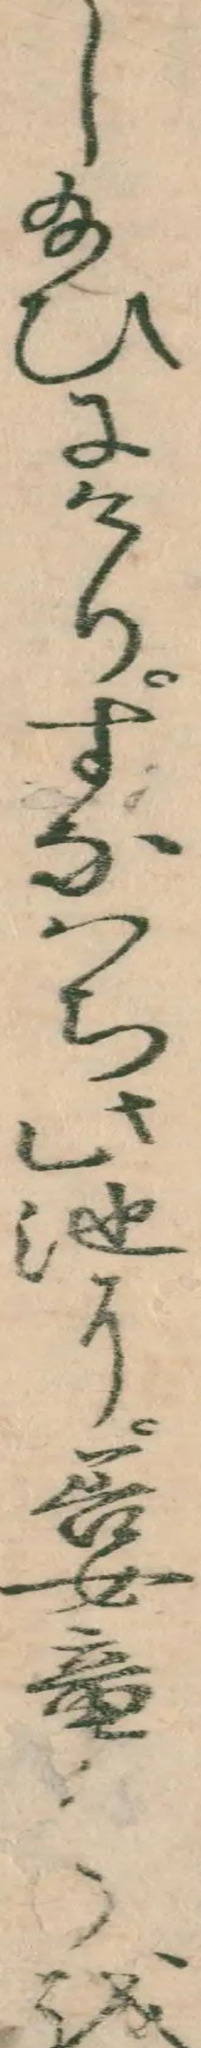し給ひにけり。すなはち此池に。善女竜わうを
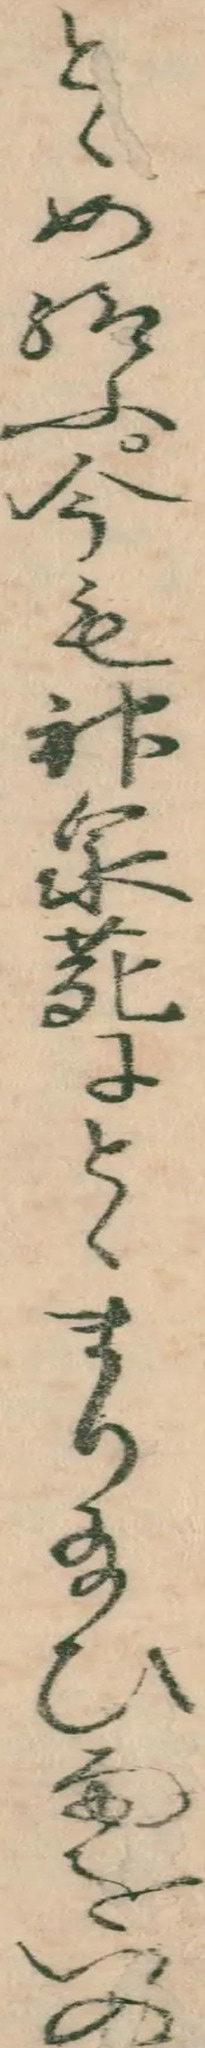とゝめ給ふ。今も神泉苑にとゝまり給ひ雨をいの
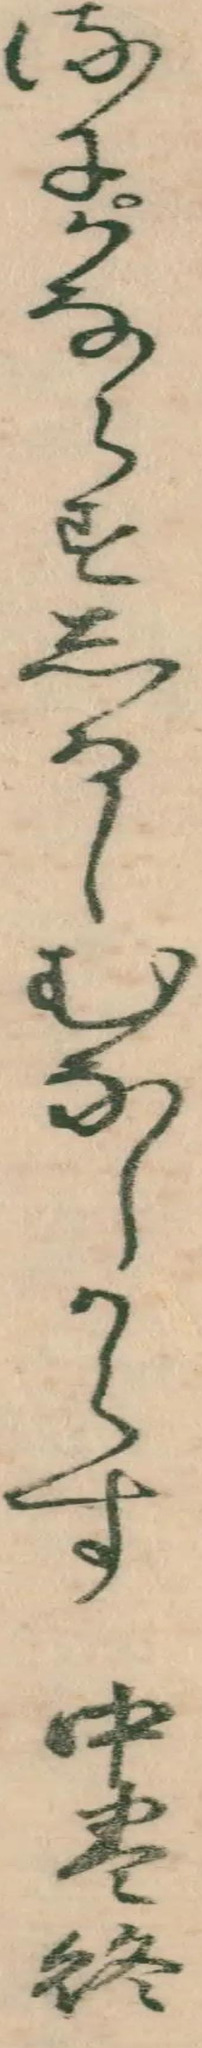るに。かならすしるしむなしからす中巻終
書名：弘法大師御本地 3巻. [2]
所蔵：国立国会図書館 National Diet Library, JAPAN
